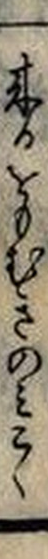来るをもむきのみて
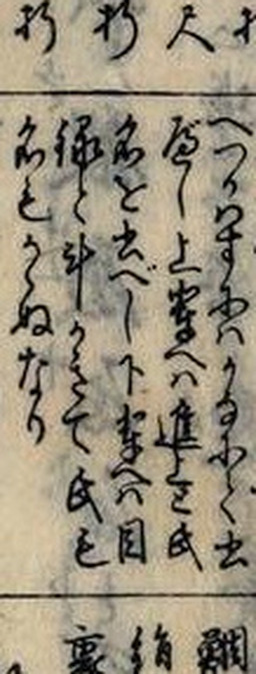名を書べし下輩へは目
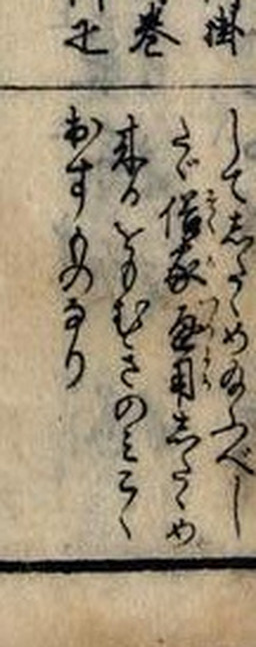来るをもむきのみて
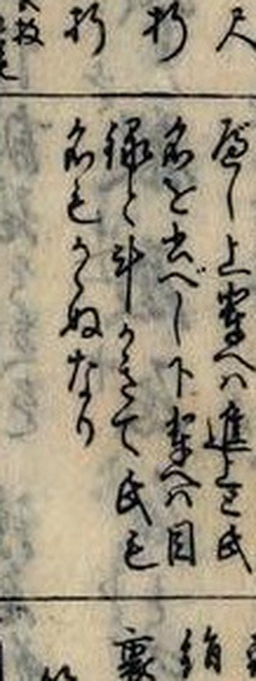録と斗かきて氏も
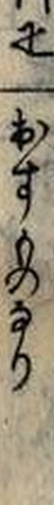出すものなり
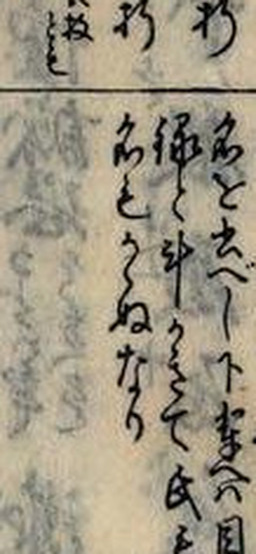名もかゝぬなり
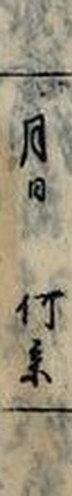月日何某
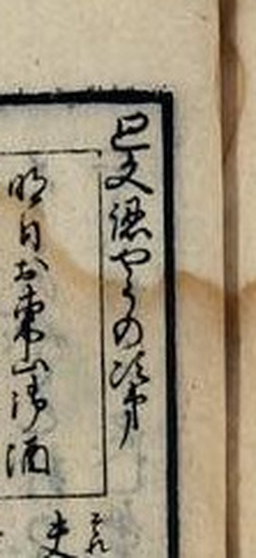廻文認やうの次第
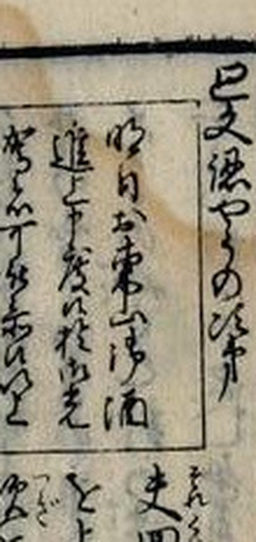明日於東山御酒
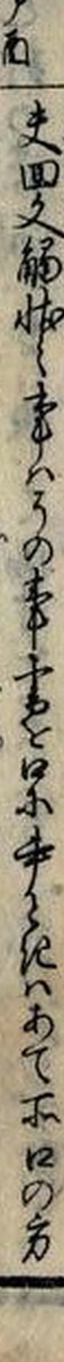夫回文触状之事はかの事書を口に書ときはあて所口の方
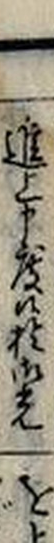進上申度候於御光
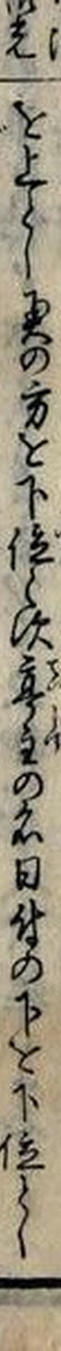を上とし奥の方を下位と次亭主の名日付の下を下位とし
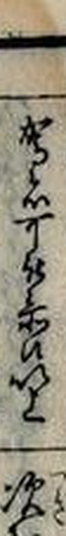駕者可被忝候以上
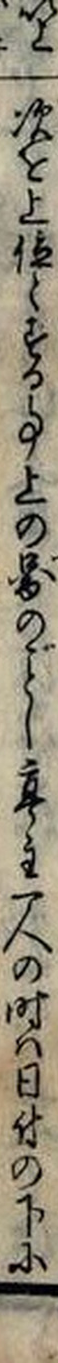次を上位とする事上の圖のごとし亭主一人の時は日付の下に
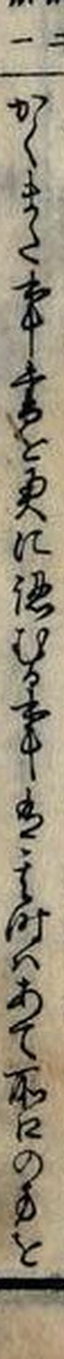かくまた事書を奥に認むる事有其時はあて所口の方を
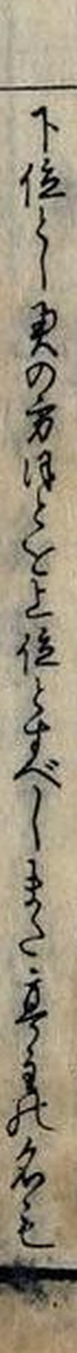下位とし奥の方ほとを上位とすべしまた亭主の名も
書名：大成用文章（往来物）
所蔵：福井県文書館 Fukui Prefectural Archives
